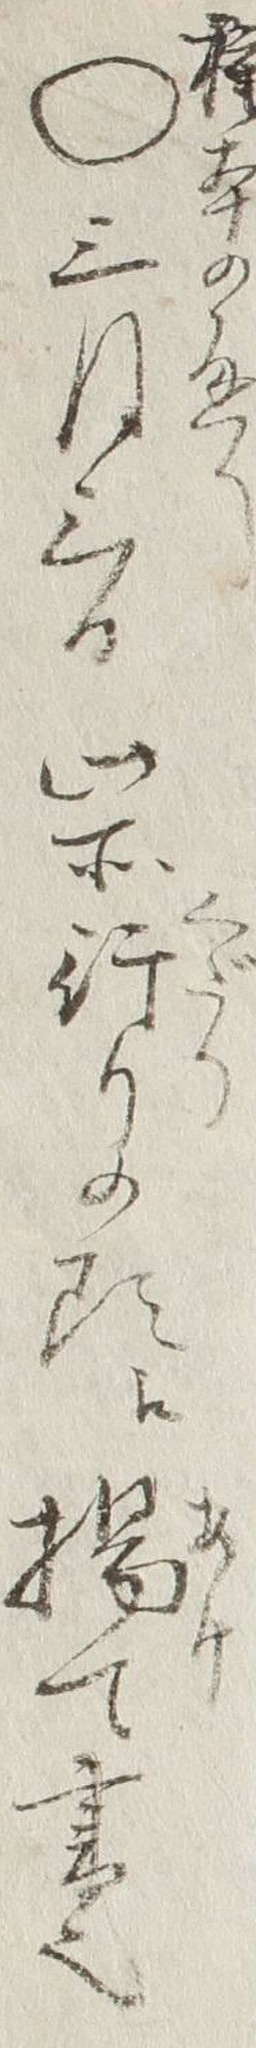〇三月三日此所行りの頭江揚て書也

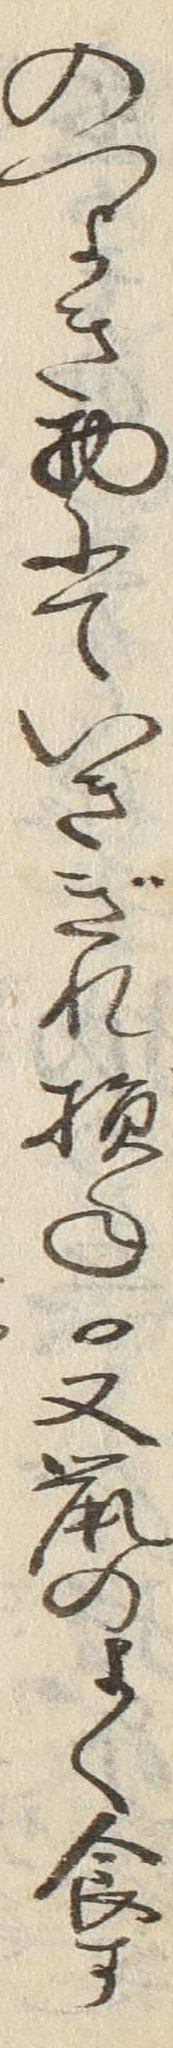のつよき物尓ていきぎれ損年〇又鼠のよく食す
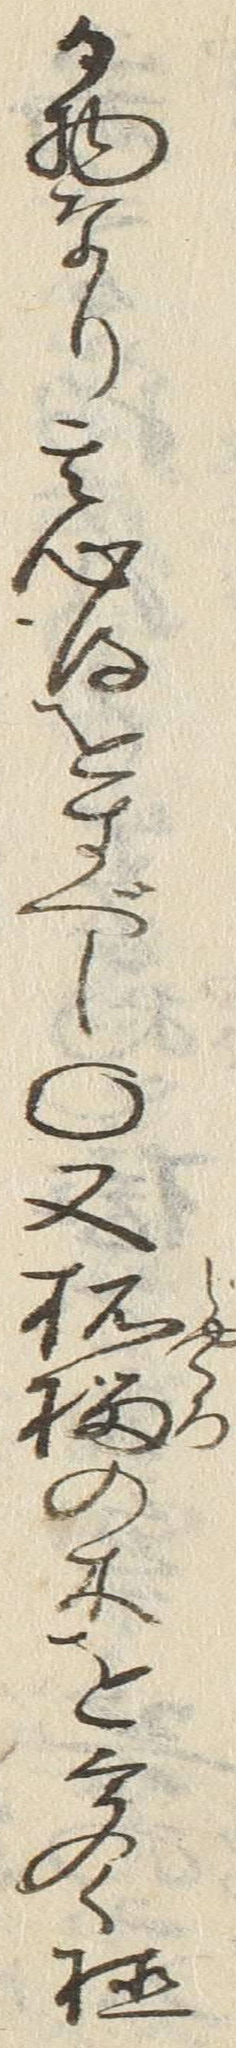る物なり其心得をすべし〇又柘榴の木を多く植
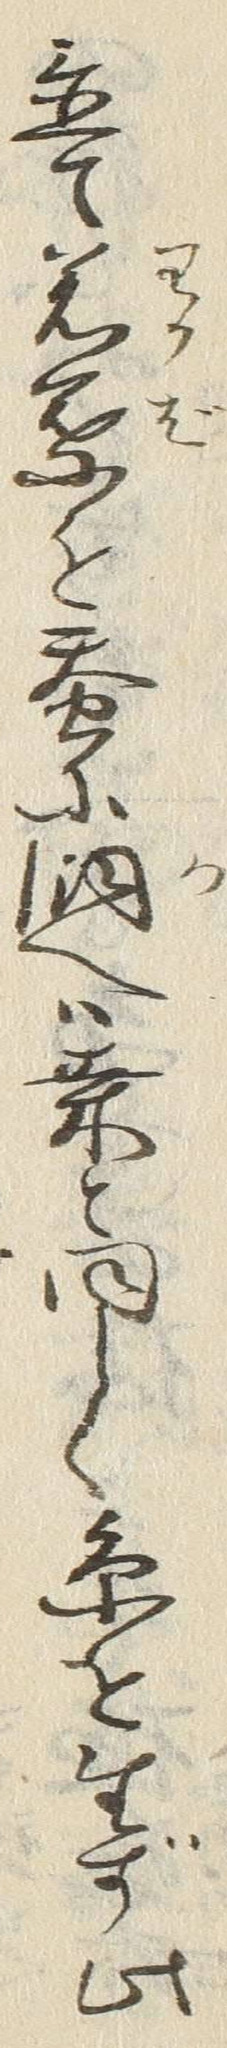置て若葉を蚕尓飼へは桑と同しく糸を生ず此
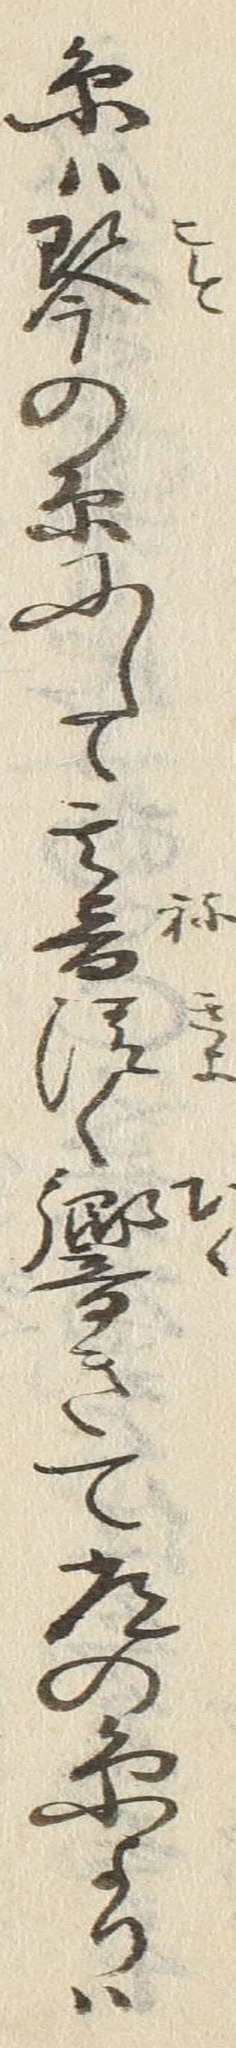糸は琴の糸尓してその其音清く響きて常の糸よりは
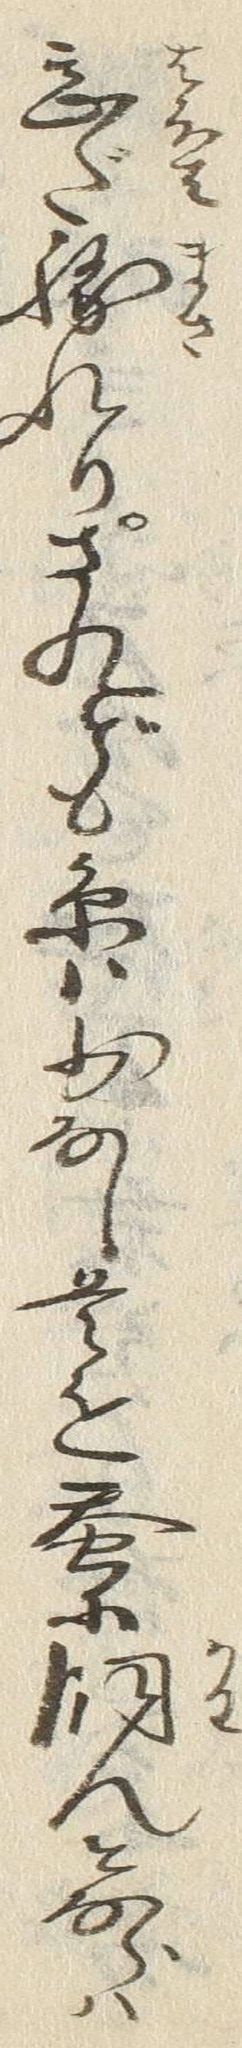甚だ勝れり。されども糸は少なし是を蚕尓飼んとならは
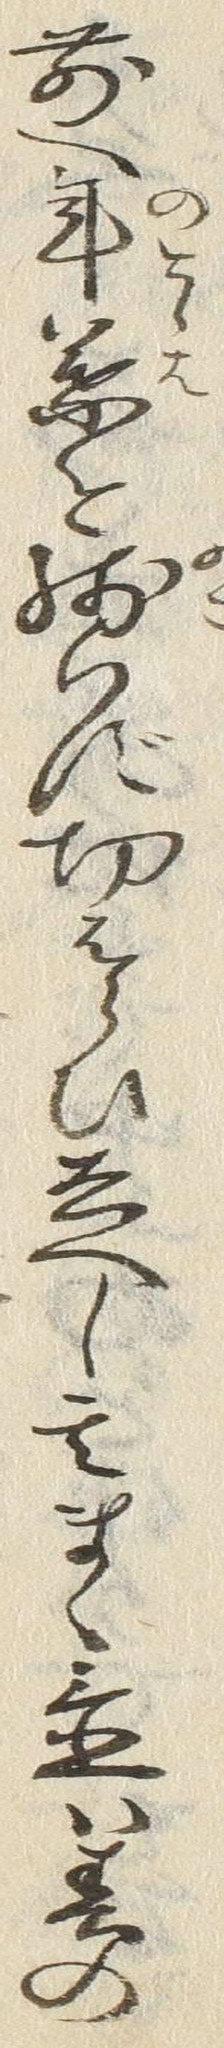前へ年葉を残らず切はらひ去へし其まく置は春の
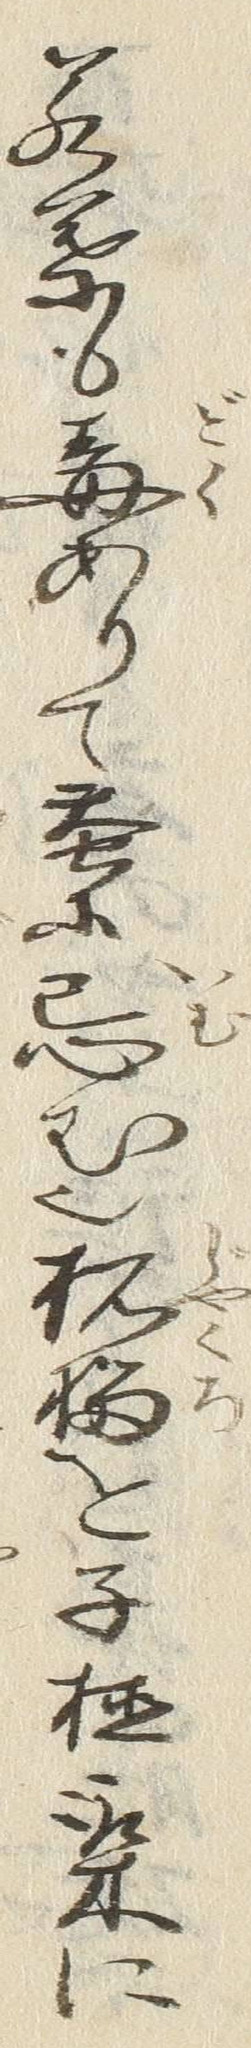若葉も毒ありて蚕尓忌む也柘榴を子植取木に
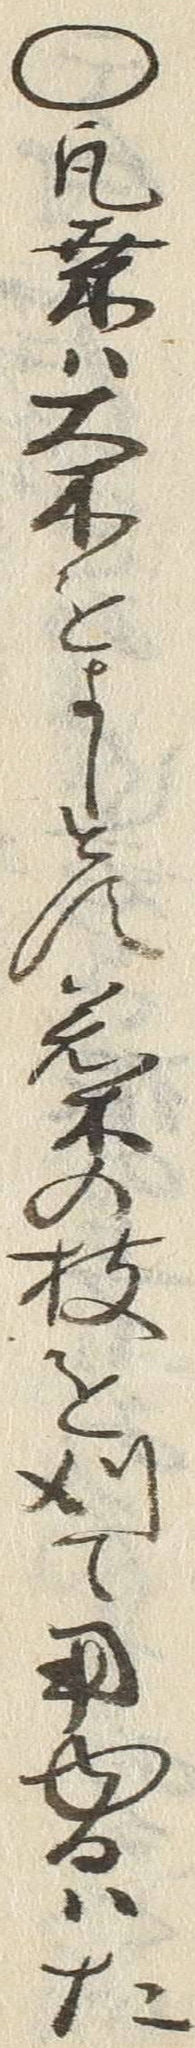〇凡桑は大木をよしと須若木の枝を刈て用ゆるはた
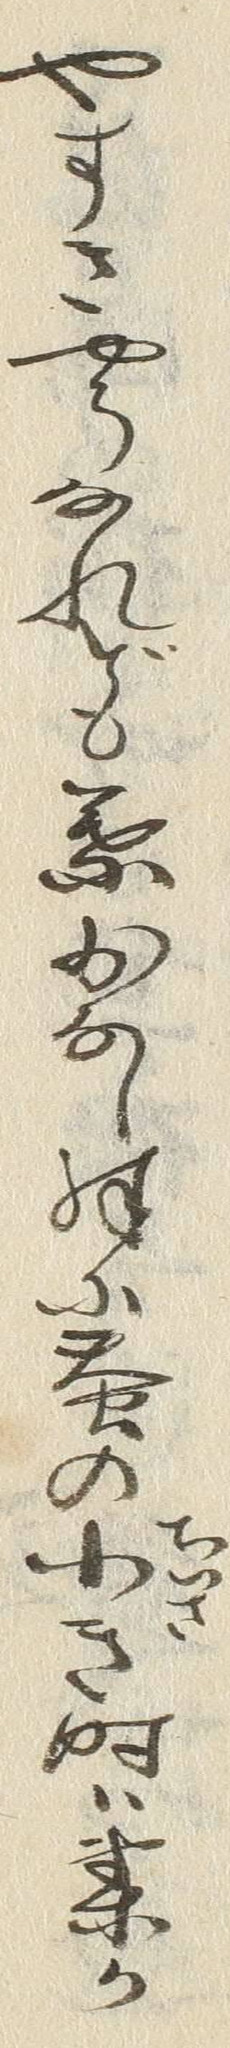やすきやうなれども葉少なし殊尓蚕の小き時は柔か
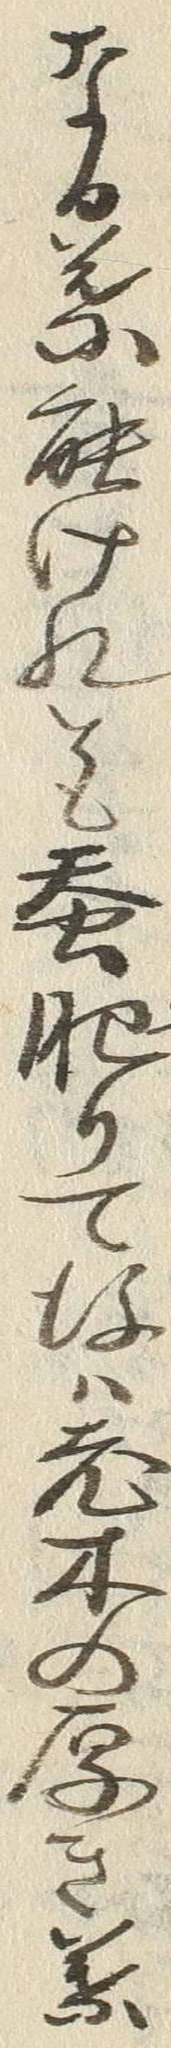なる葉能けれとも蚕肥りて後は老木の厚き葉
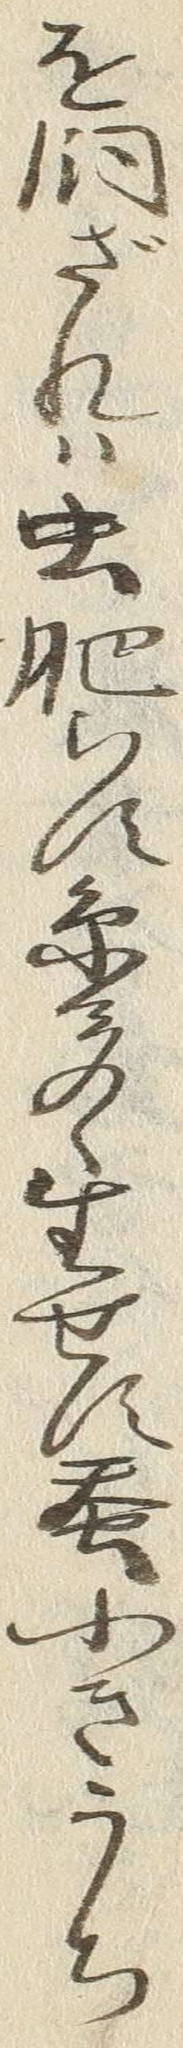を飼ざれは虫肥ら須糸多く生せ須蚕小きうち
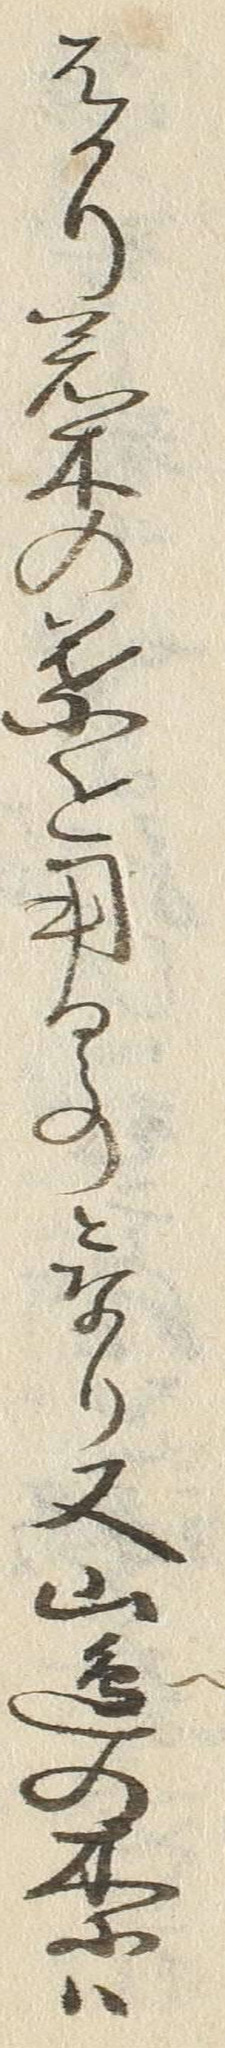はかり若木の葉を用る事となり又山邊の木尓は
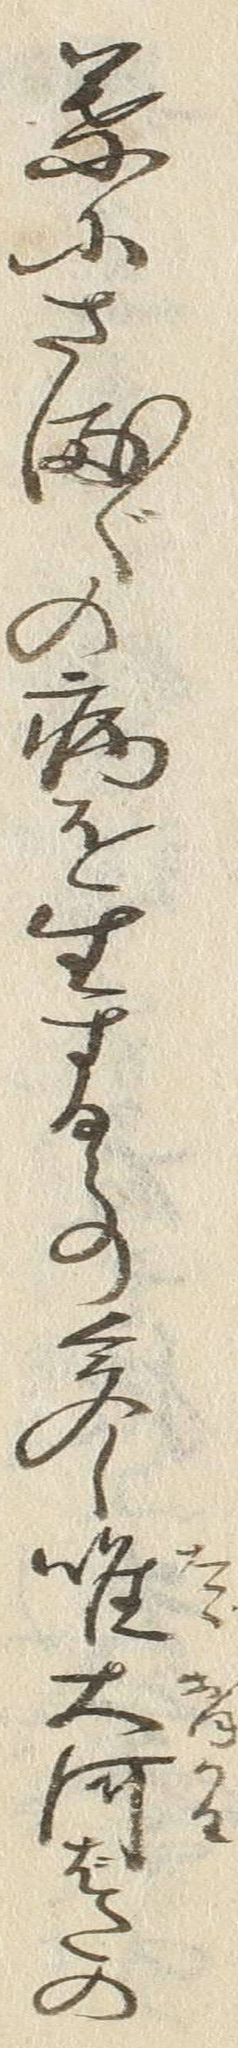葉尓さ満〴〵の病を生する事多し唯大河ばたの
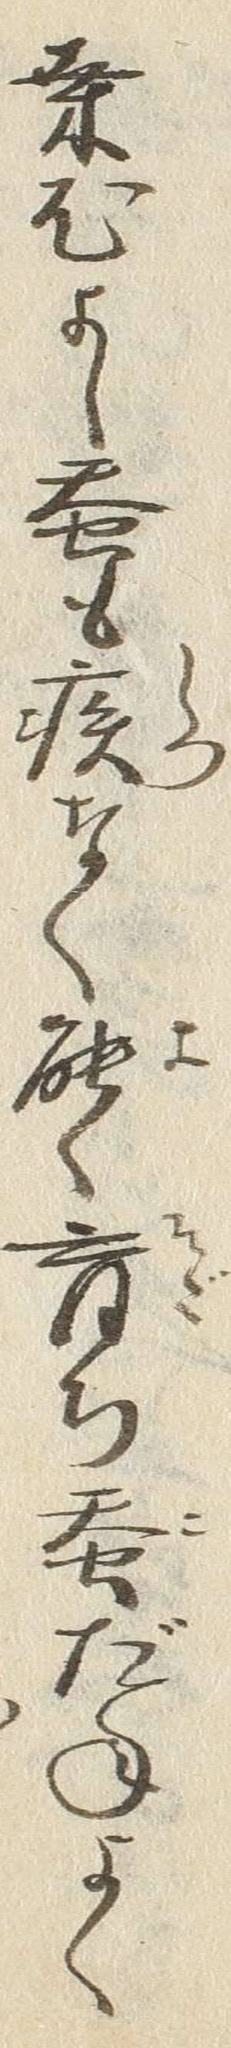桑尤よし蚕も疾なく能く育ち蚕だ年よく
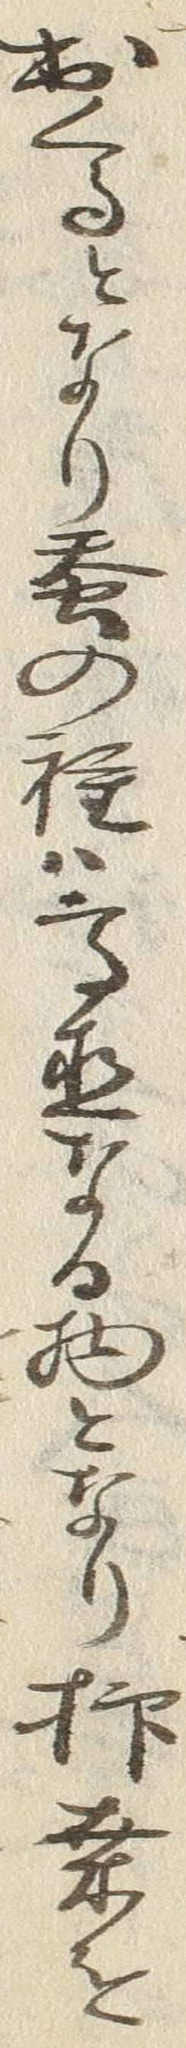出くるとなり蚕の種は高直なる物となり抑桑を
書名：養蠶實驗録後編
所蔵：東京大学農学生命科学図書館 国文学研究資料館
